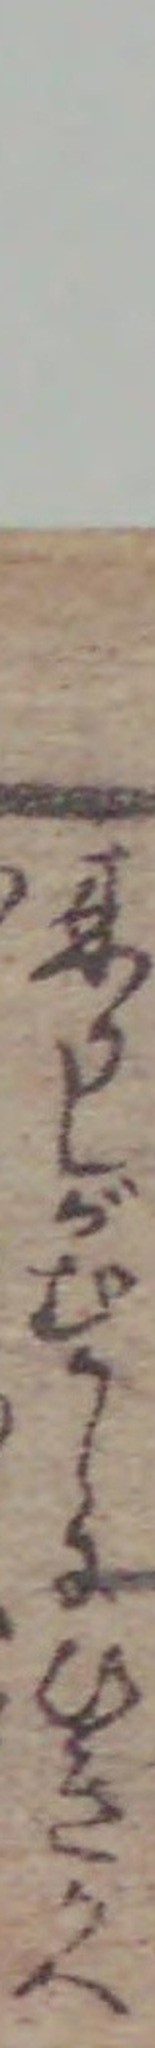来りしがむかしにひきかへ
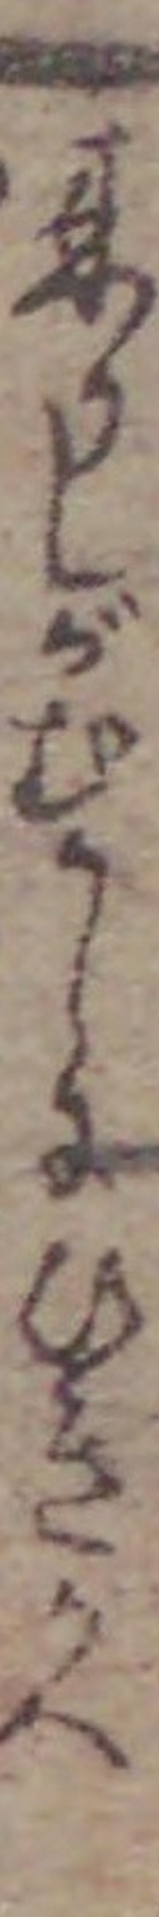来りしがむかしにひきかへ
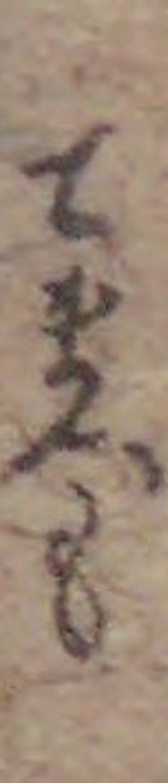てまへも
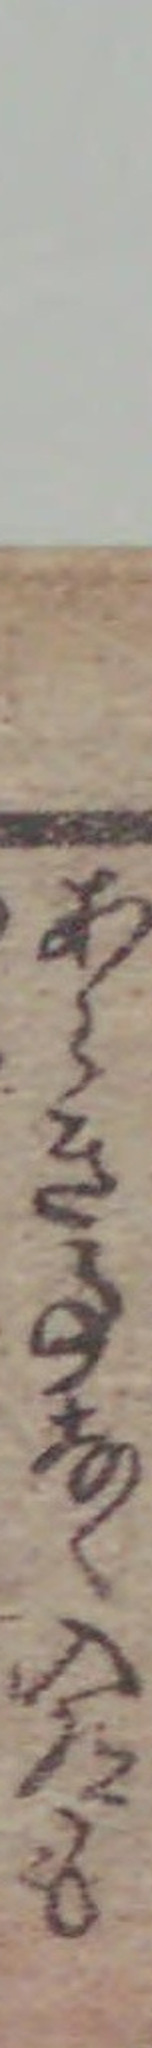あらき事なく入道も
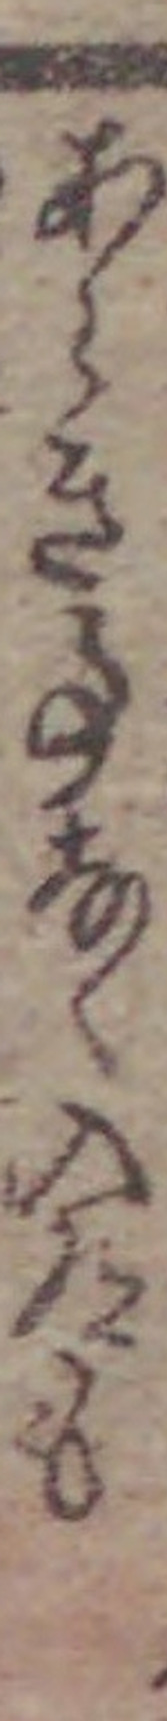あらき事なく入道も
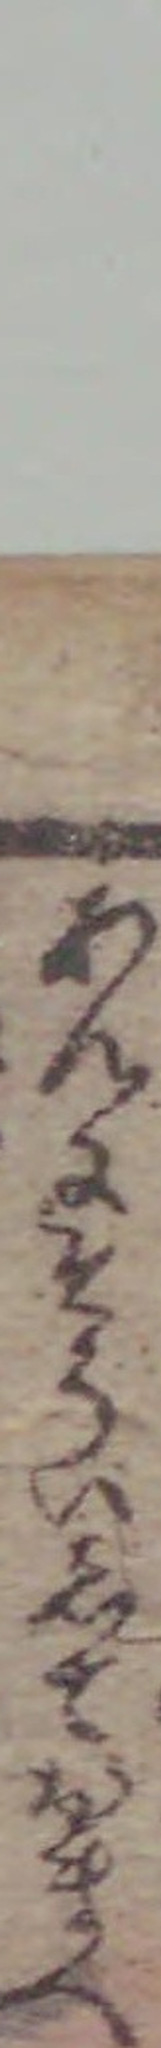あんにそういしておまへ
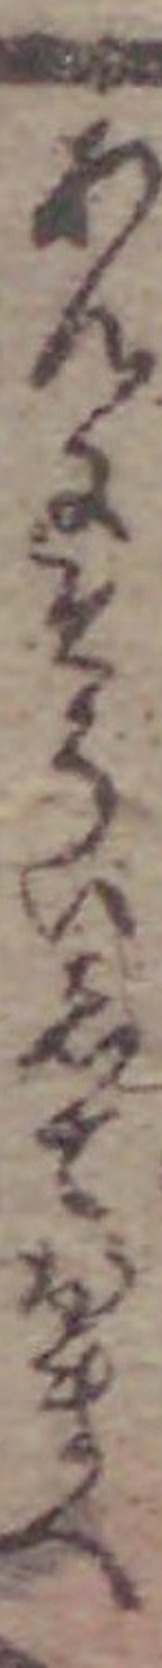あんにそういしておまへ
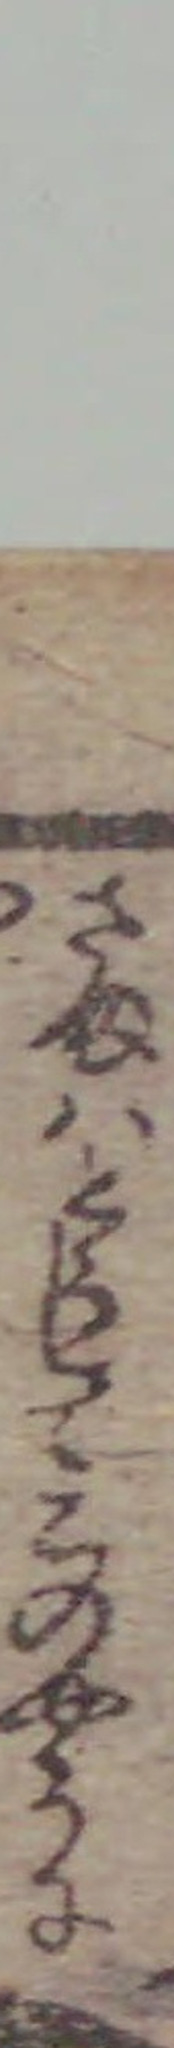さまはとうしてこのやうに
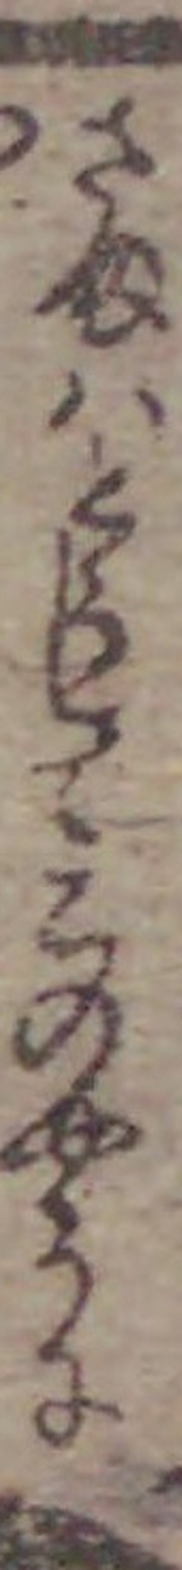さまはとうしてこのやうに
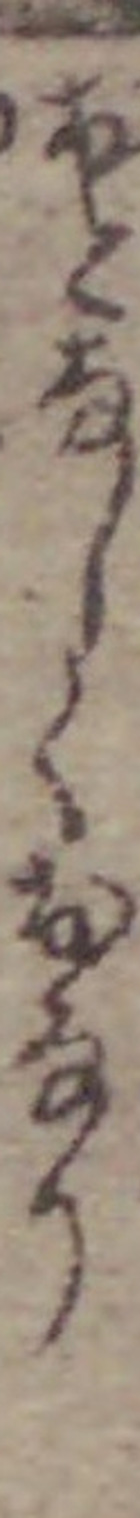おとなしくおなり
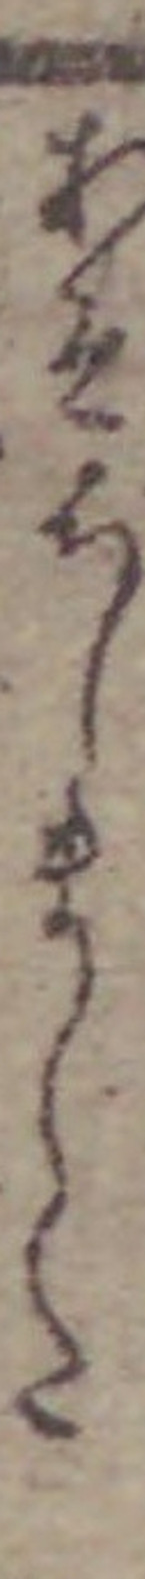あそばしました
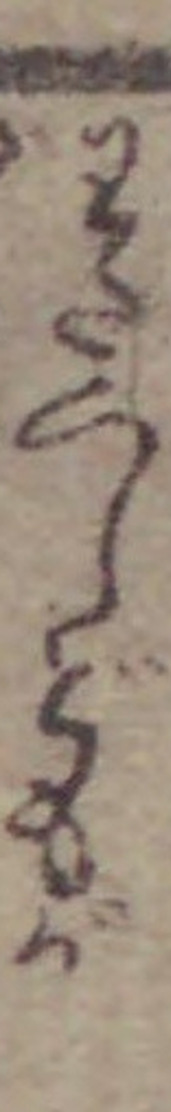わたくしどもが
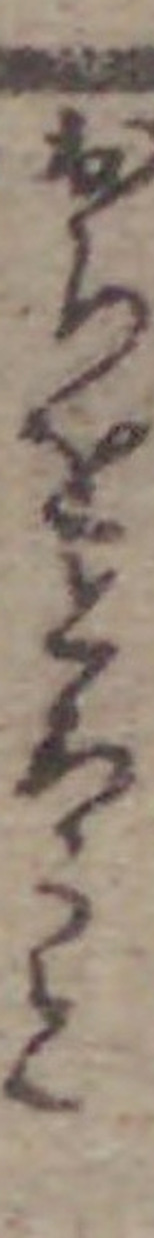おちをとらうと
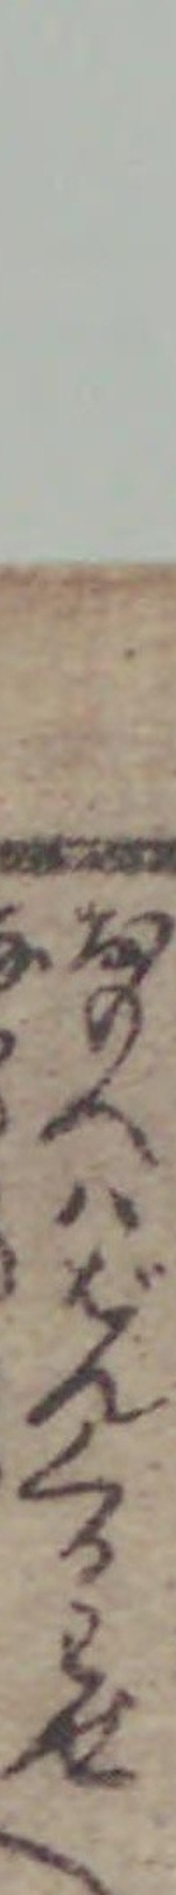おもへはばんくるわせ
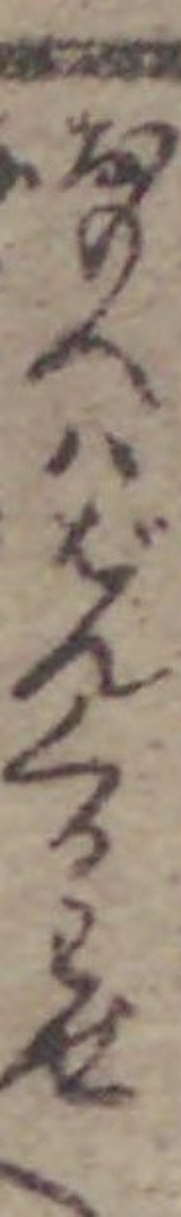おもへはばんくるわせ
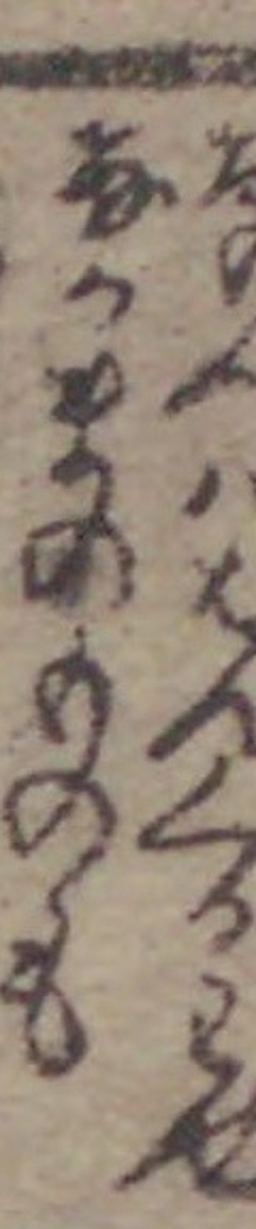なかまのものも
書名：化物鼻がひしげ 2巻
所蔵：国立国会図書館 National Diet Library, JAPAN
